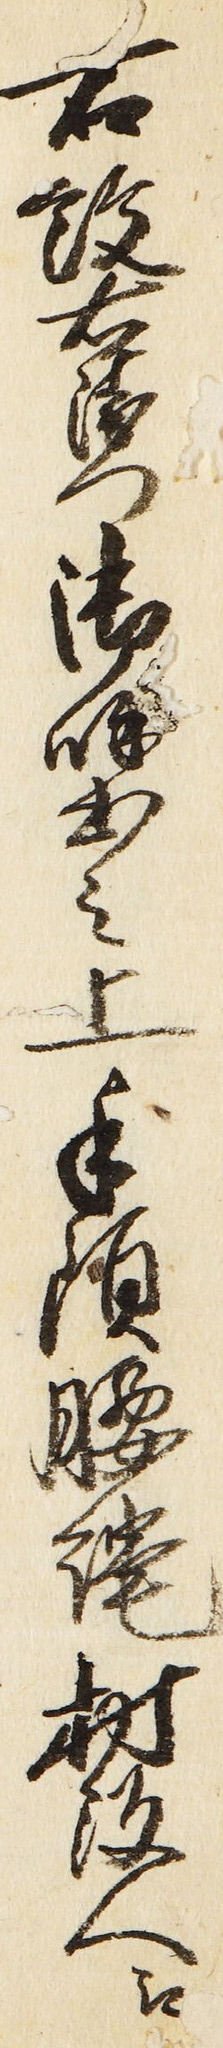右政右衛門御呼出之上手鎖腰縄村役人江
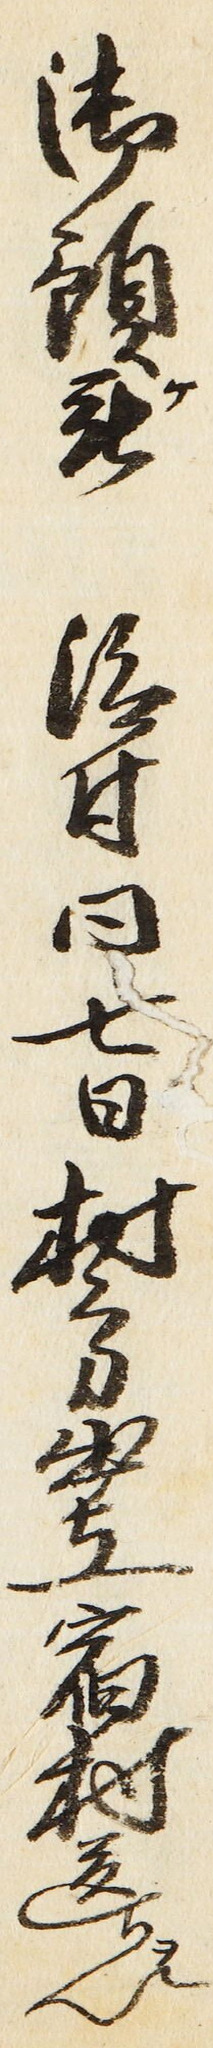御預ケ被仰付同七日村方出立宿村送りヲ以
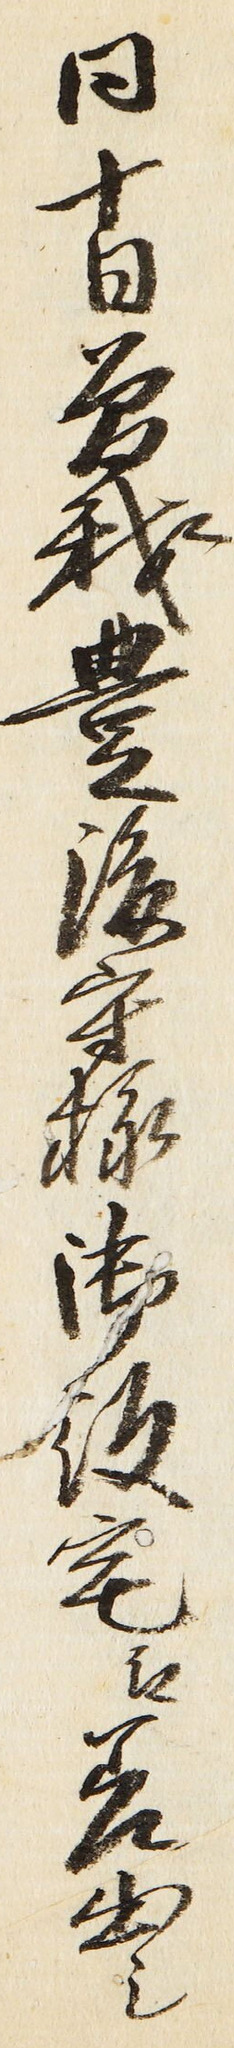同十日曽我豊後守様御役宅江差出シ
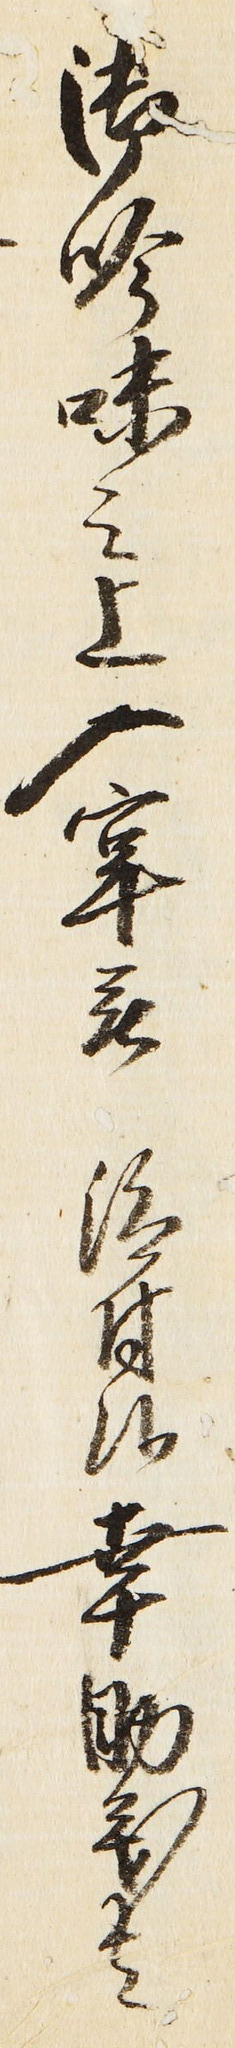御吟味之上入牢被仰付候幸助義者
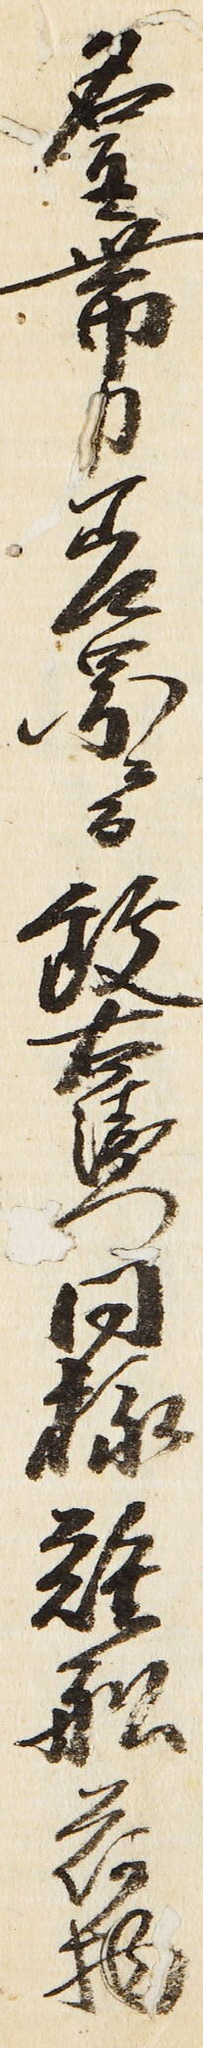名主帯刀差図ニ而政右衛門同様難船荷物
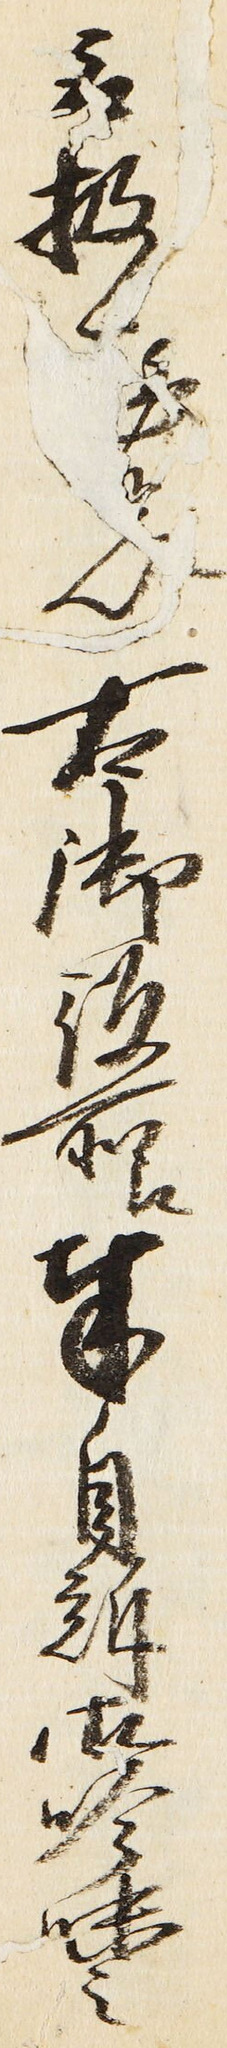取扱を以右御役所江奉自訴御吟味之
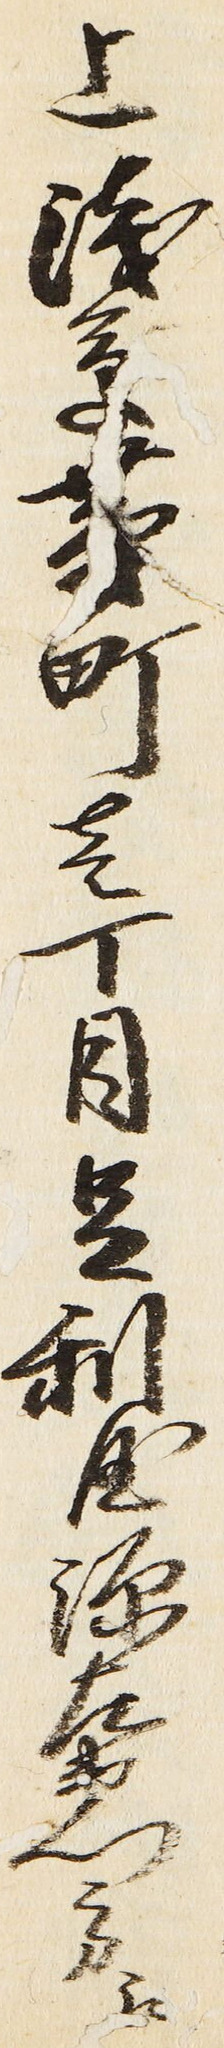上浅草茅町壱丁目足利屋源左衛門方江
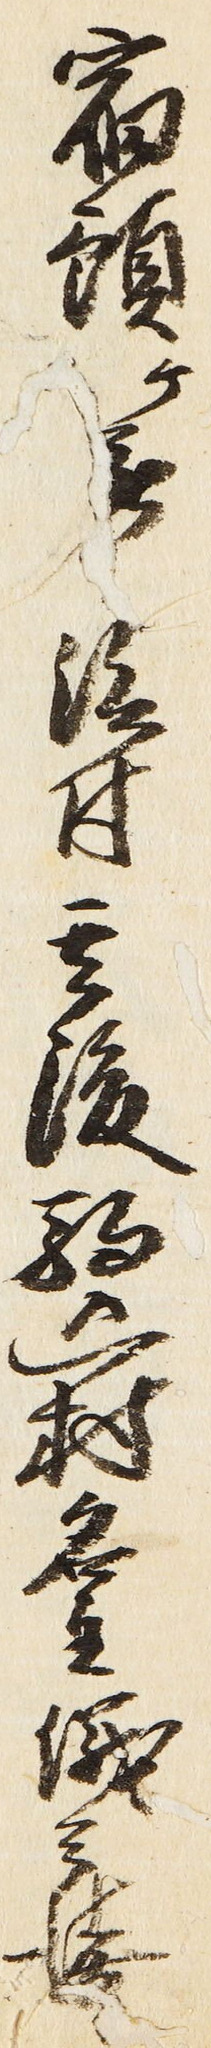宿預ケ被仰付其後駒込村名主儀兵衛
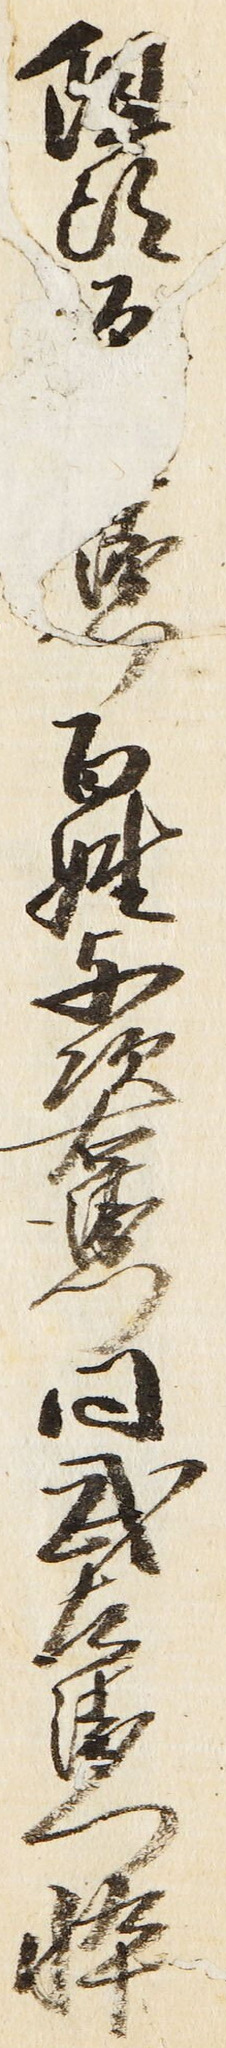組頭百姓与次右衛門同武左衛門忰
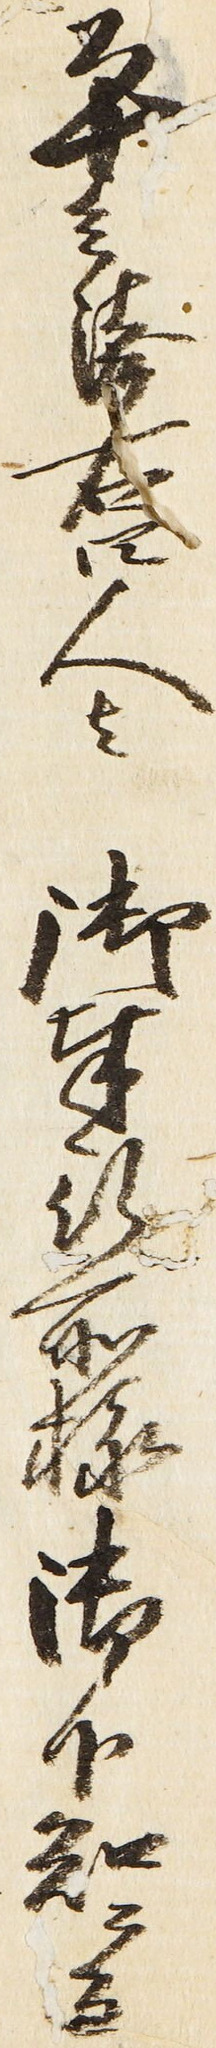平兵衛右四人者御奉行所様御下知ニ而
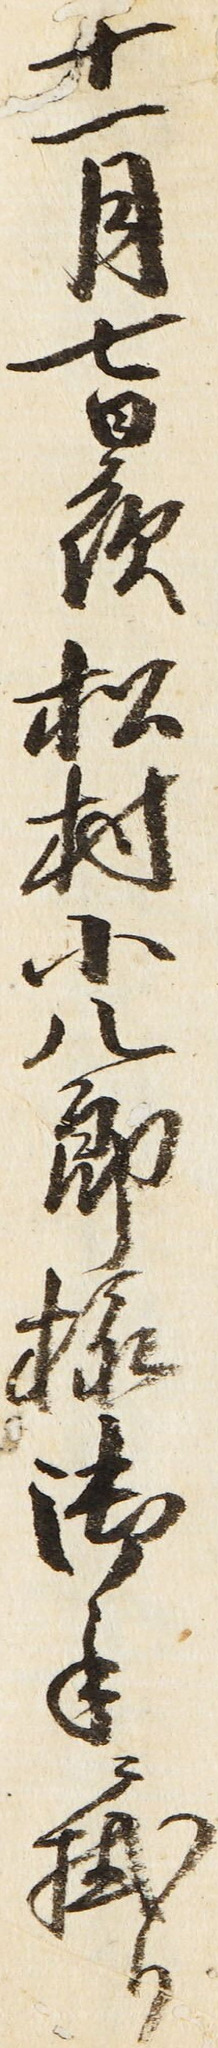十一月七日夜松村小八郎様御手ニ掛り
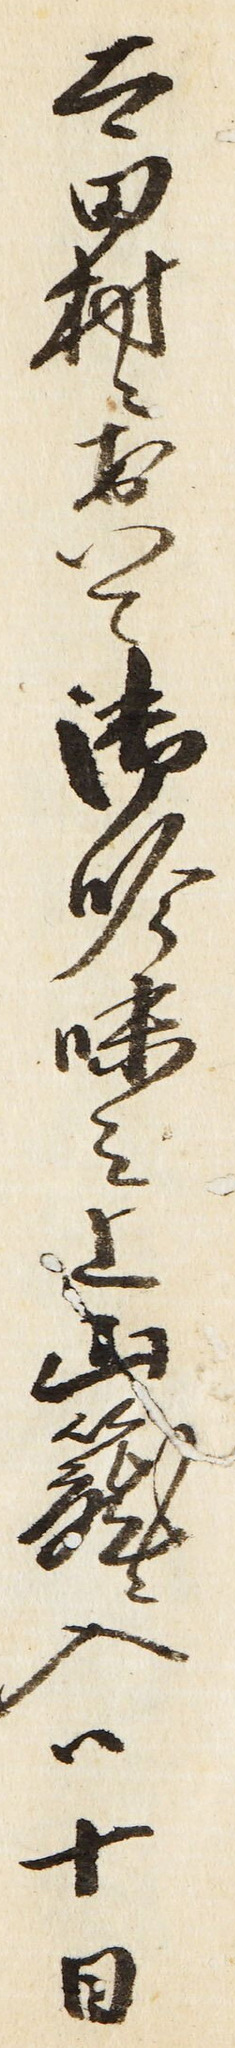太田村ニおいて御吟味之上山籠ニ入同十日
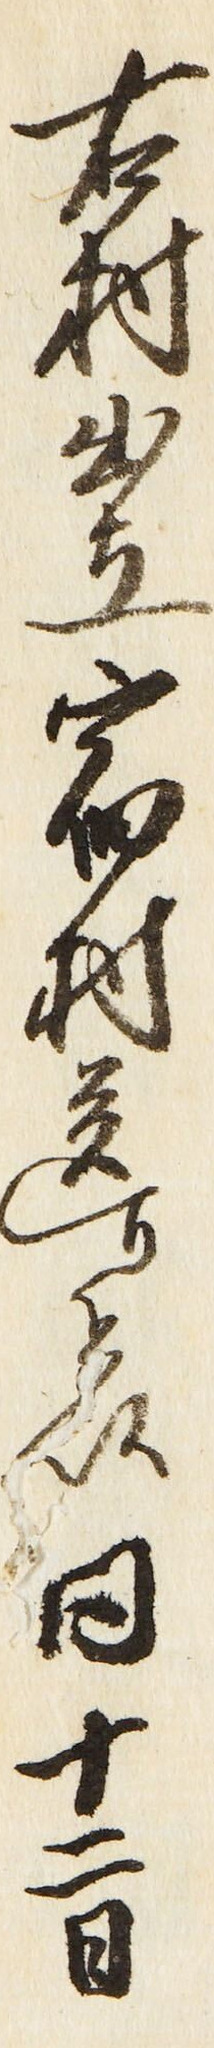右村出立宿村送りを以同十二日
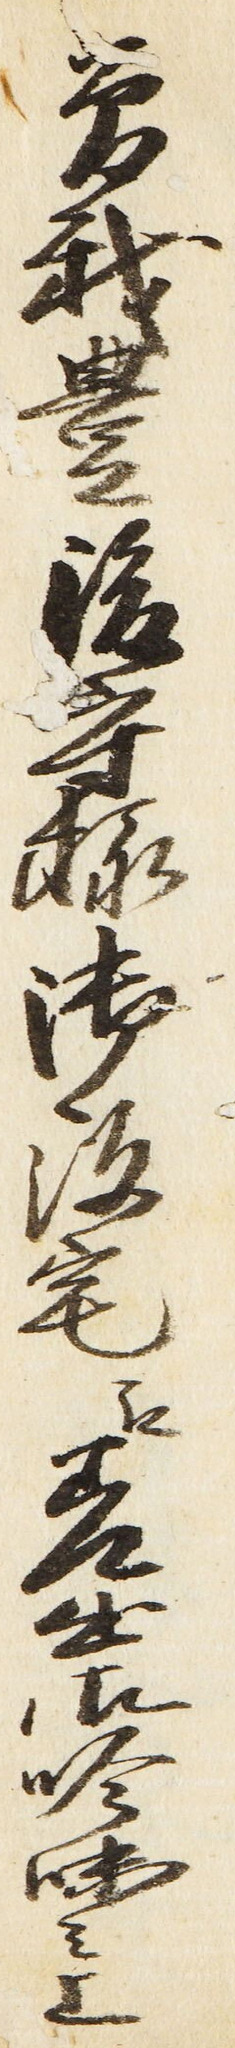曽我豊後守様御役宅江差出御吟味之上

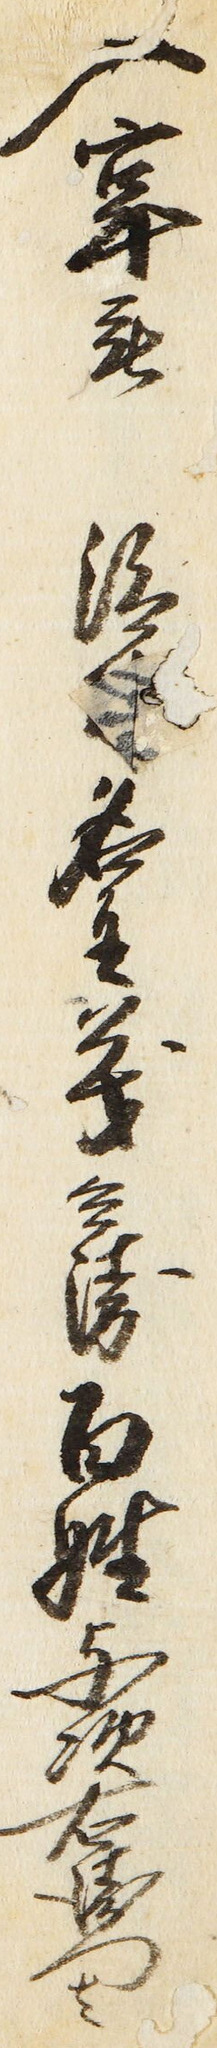入牢被仰付名主義兵衛百姓与次右衛門者
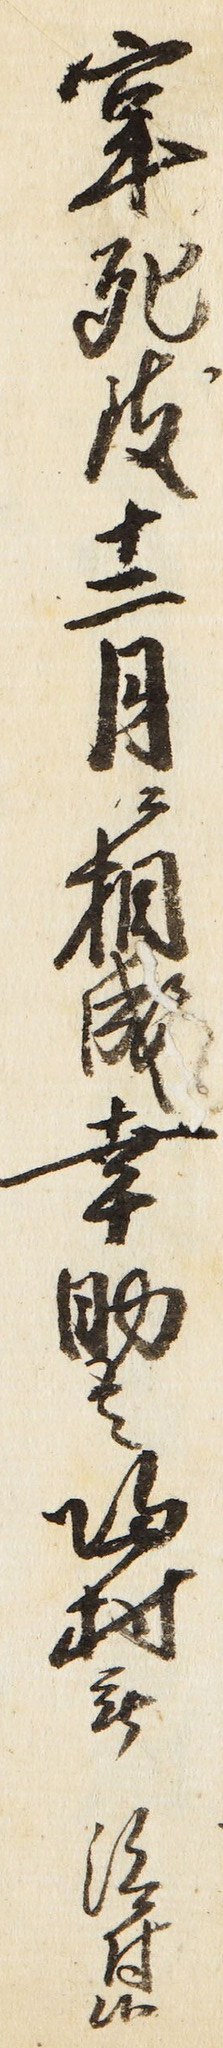牢死致十二月ニ相成幸助者帰村被仰付候
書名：難船一件記録
